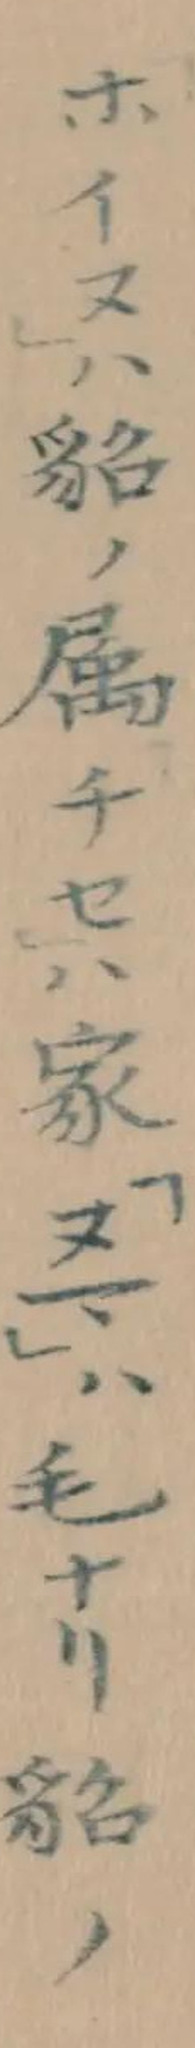「ホイヌ」ハ貂ノ属「チセ」ハ家「ヌマ」ハ毛ナリ貂ノ
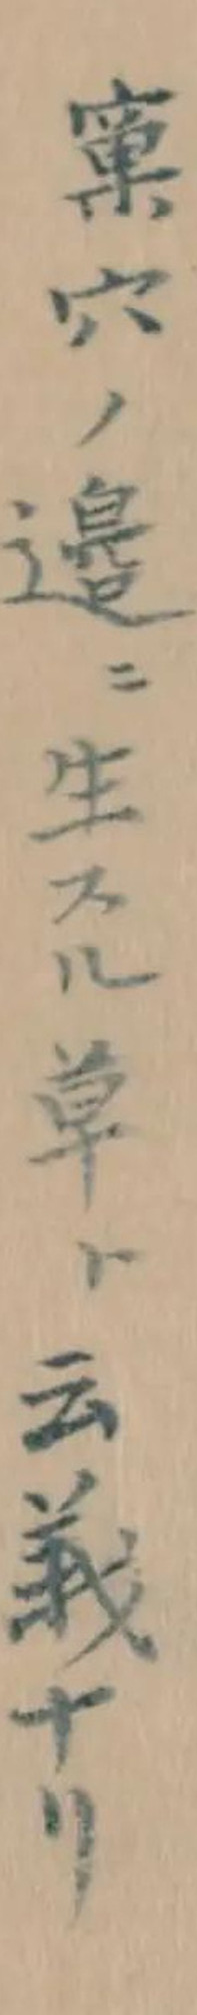窠穴ノ辺ニ生スル草ト云義ナリ
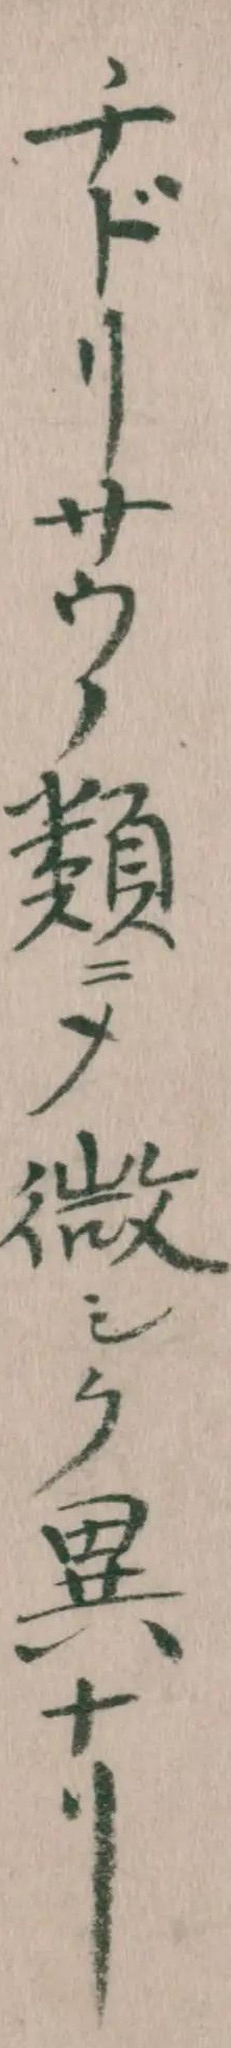チドリサウノ類ニシテ微シク異ナリ
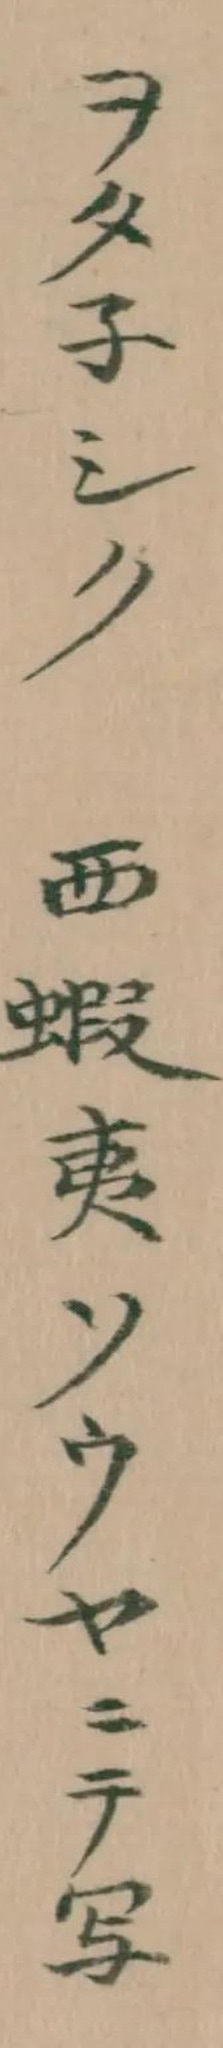ヲタネシク西蝦夷ソウヤニテ写

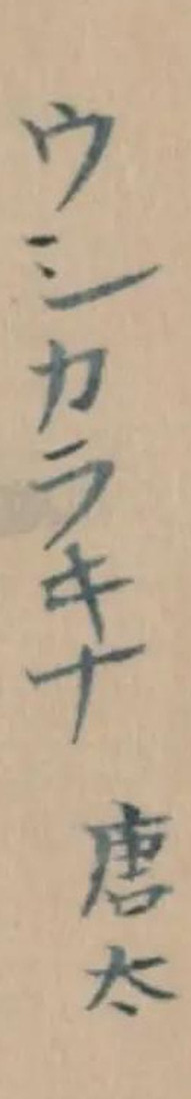ウシカラキナ唐太

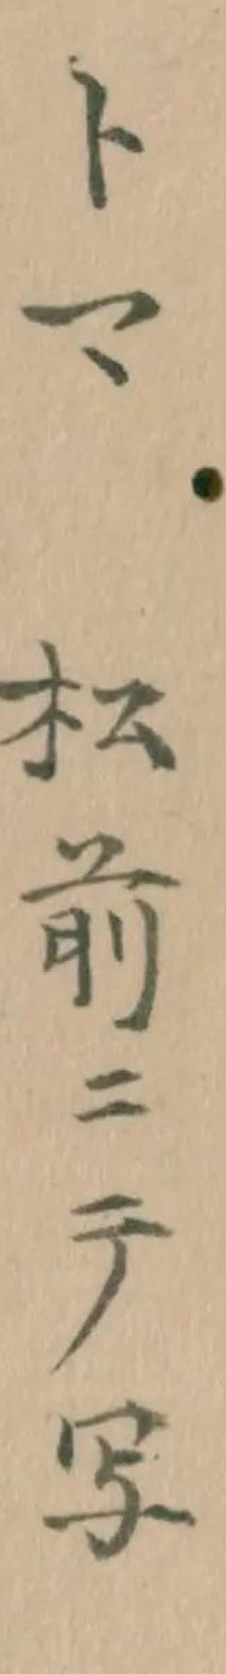トマ松前ニテ写
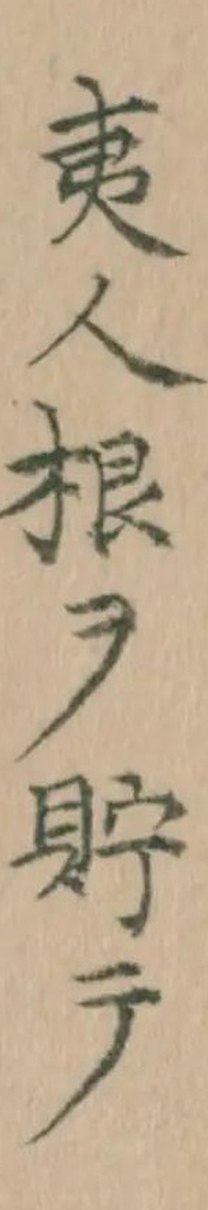夷人根ヲ貯テ
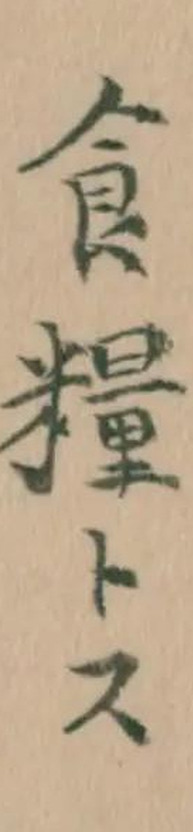食糧トス
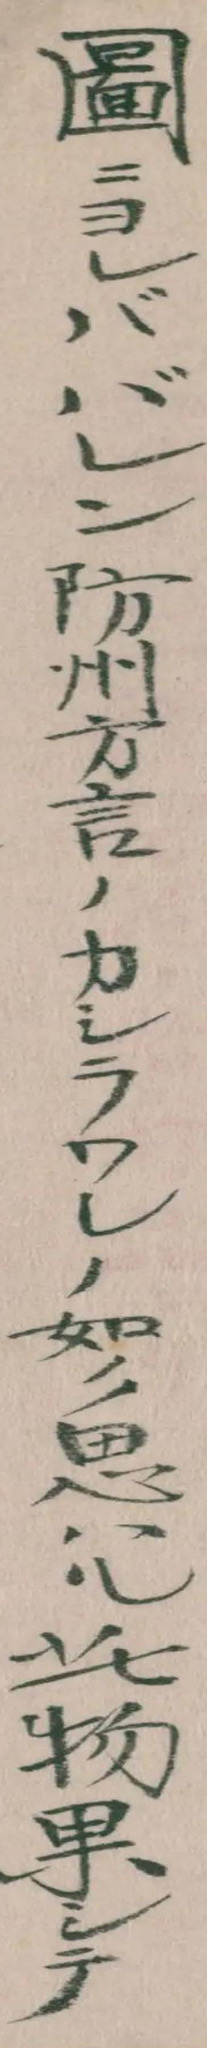図ニヨレババレン防州方言ノカシラワレノ如ク思ハル此物果シテ
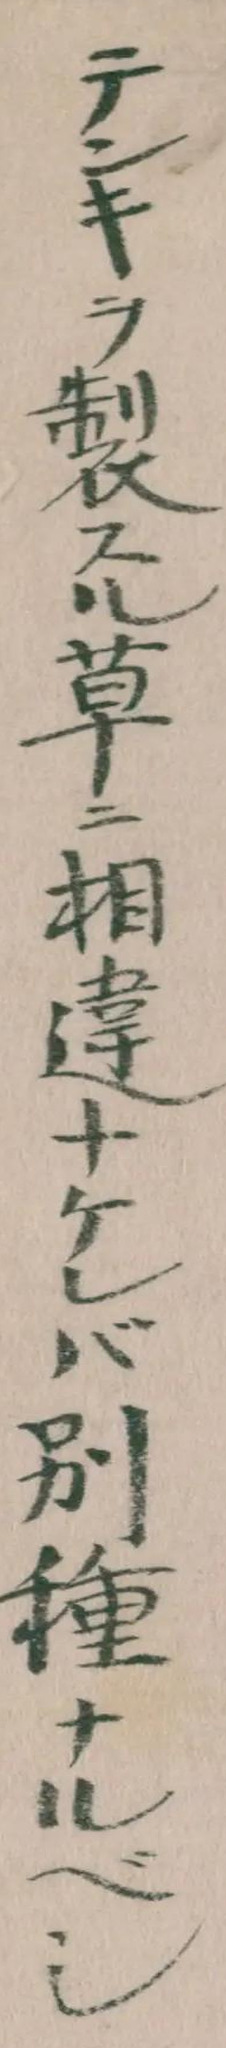テンキヲ製スル草ニ相違ナケレバ別種ナルベシ
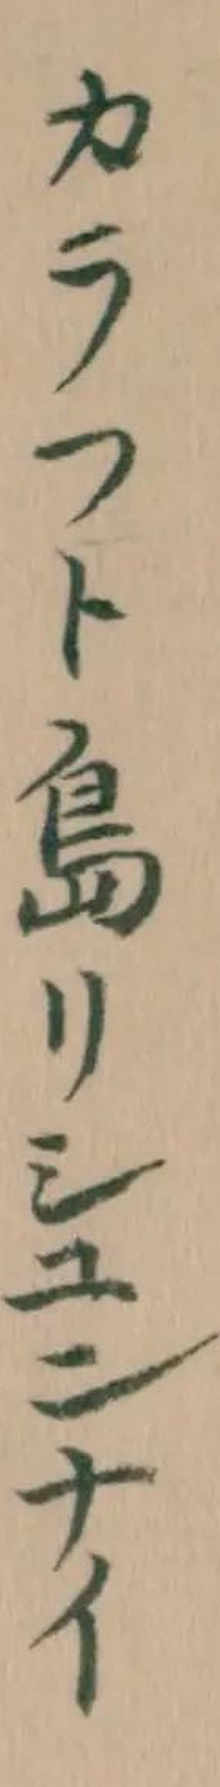カラフト島リシユンナイ
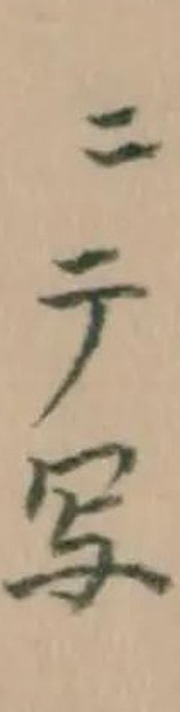ニテ写
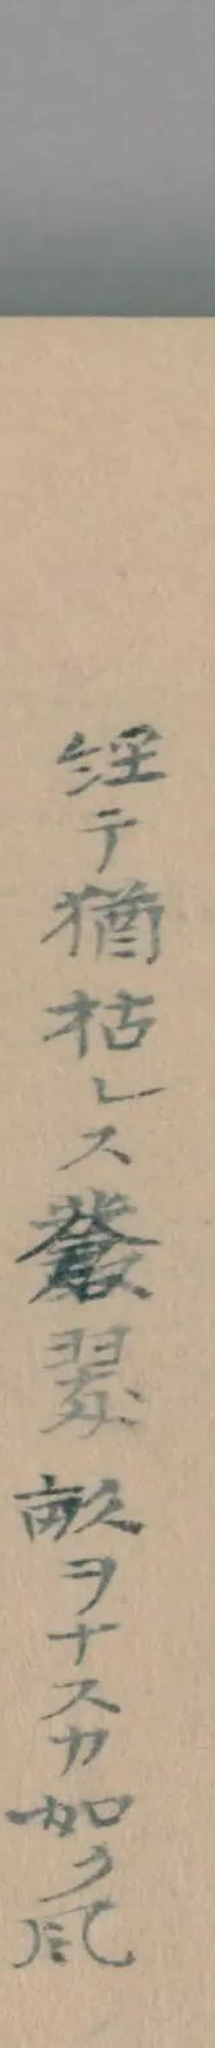経テ猶枯レス蒼蓼？畝ヲナスカ如ク風
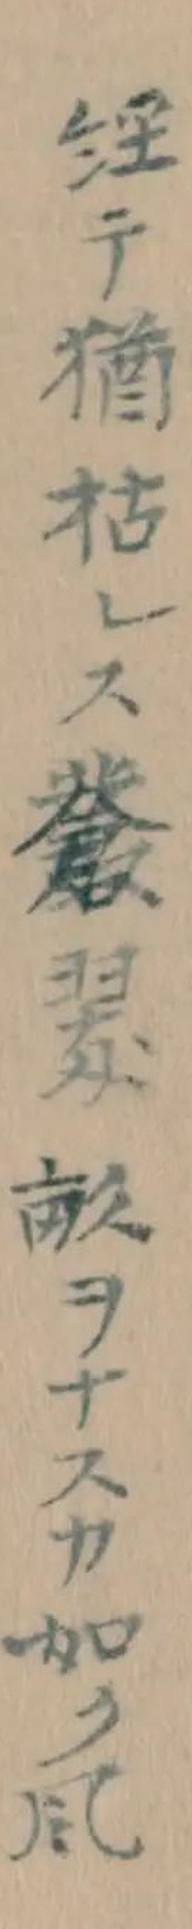経テ猶枯レス蒼蓼？畝ヲナスカ如ク風
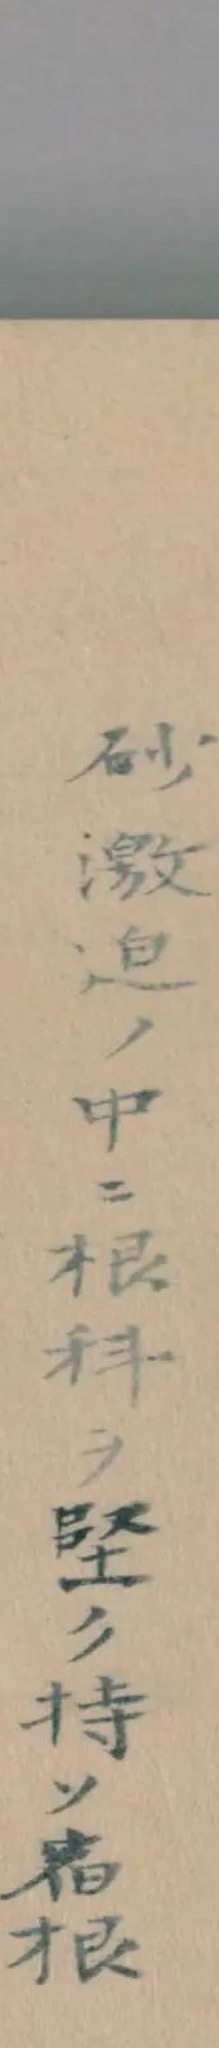砂激迫ノ中ニ根科ヲ堅ク持シテ宿根
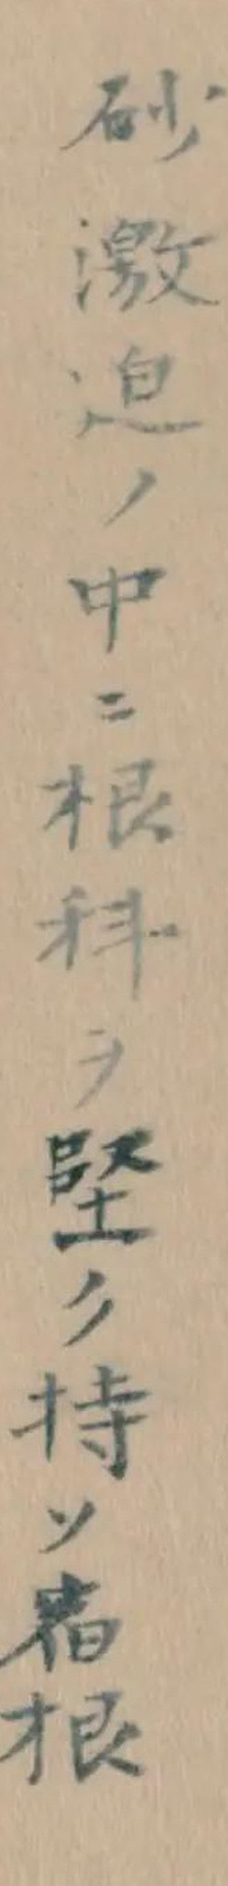砂激迫ノ中ニ根科ヲ堅ク持シテ宿根
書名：蝦夷草木図
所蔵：国立国会図書館 National Diet Library, JAPAN
